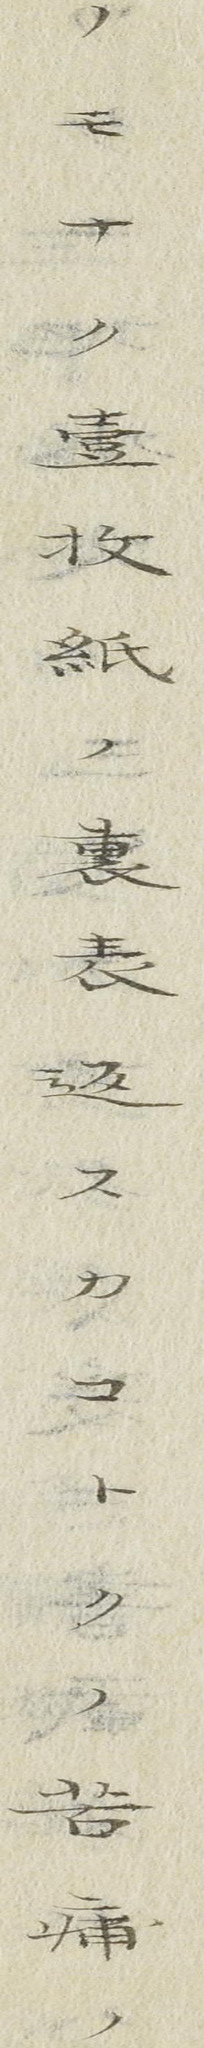ノモナク壹枚紙ノ裏表返スカコトクノ苦痛ノ
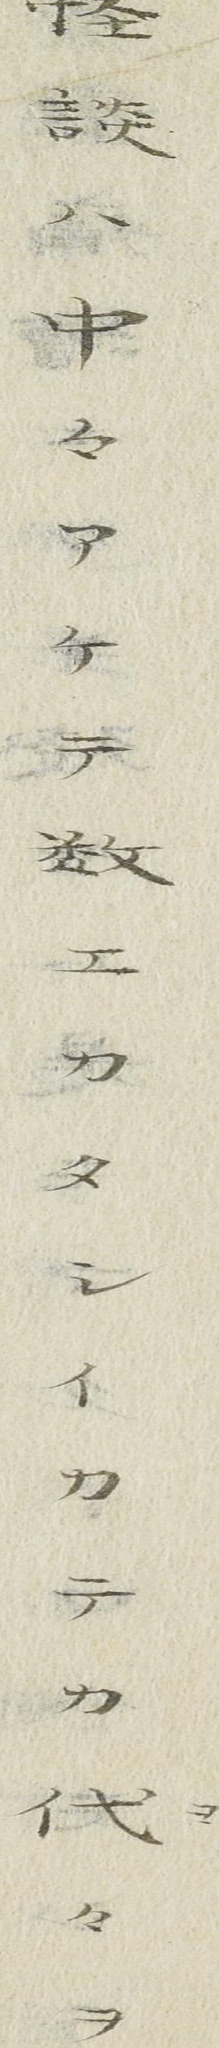怪談ハ中々アケテ数エカタシイカテカ代ヨ々ヲ

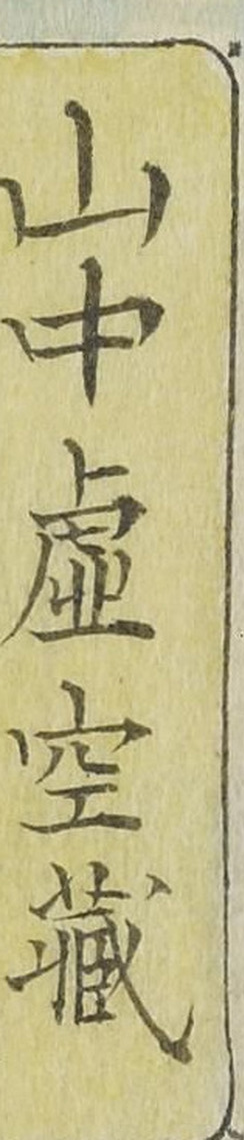山中虚空蔵
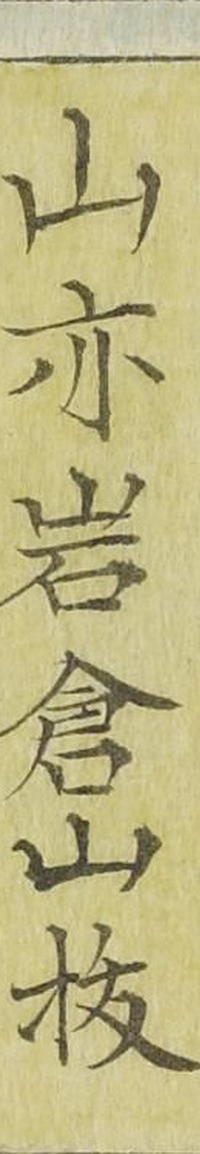山亦岩倉山抜
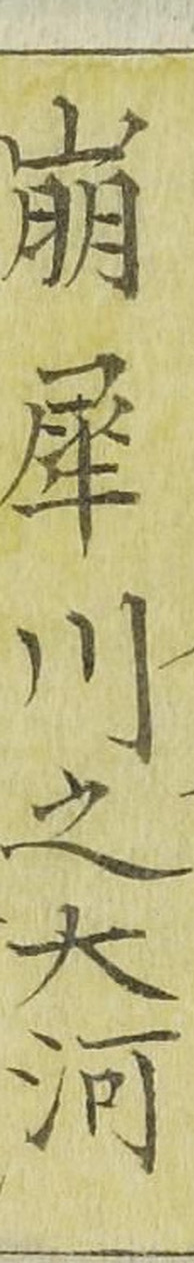崩犀川之大河
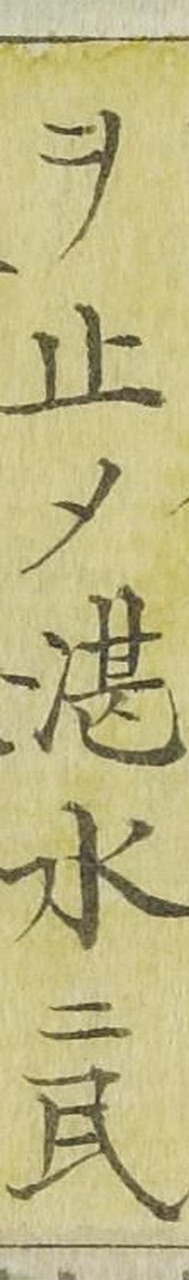ヲ止メ湛水ニ民
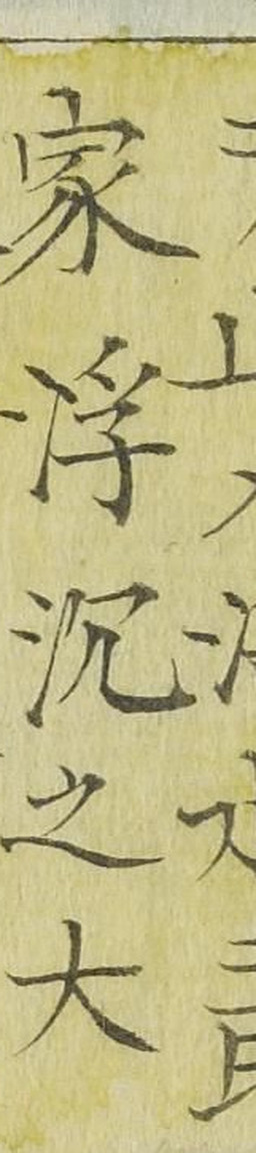家浮沈之大
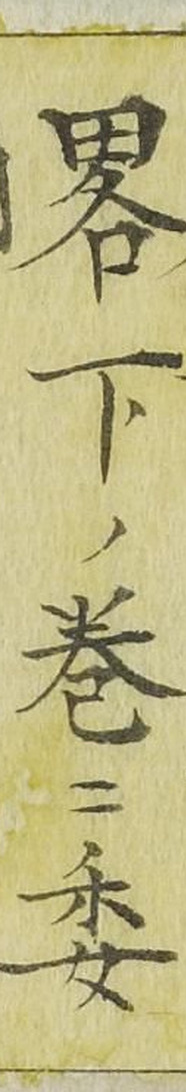略下ノ巻ニ委

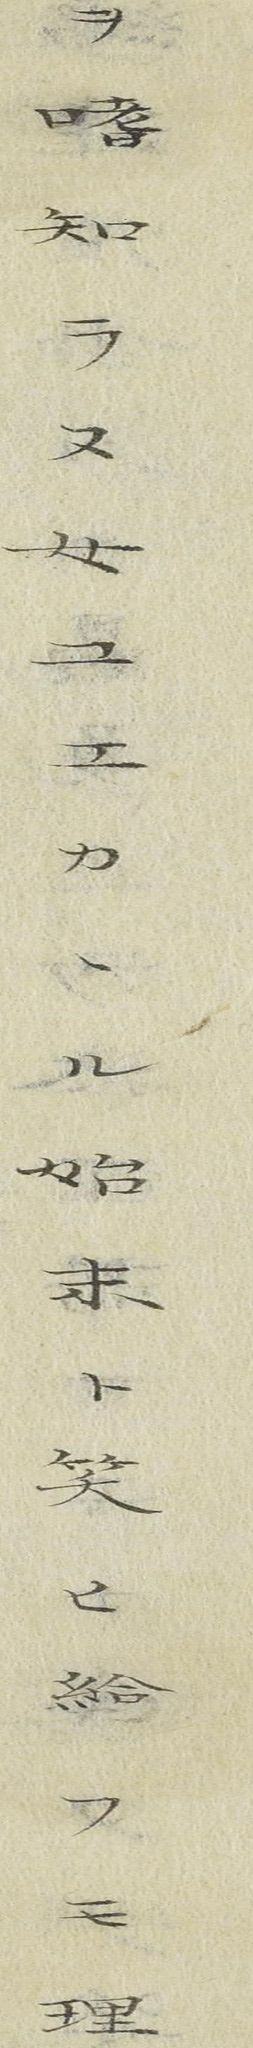ヲ嗜知ラス女ユエカヽル始末ト笑ヒ給フモ理
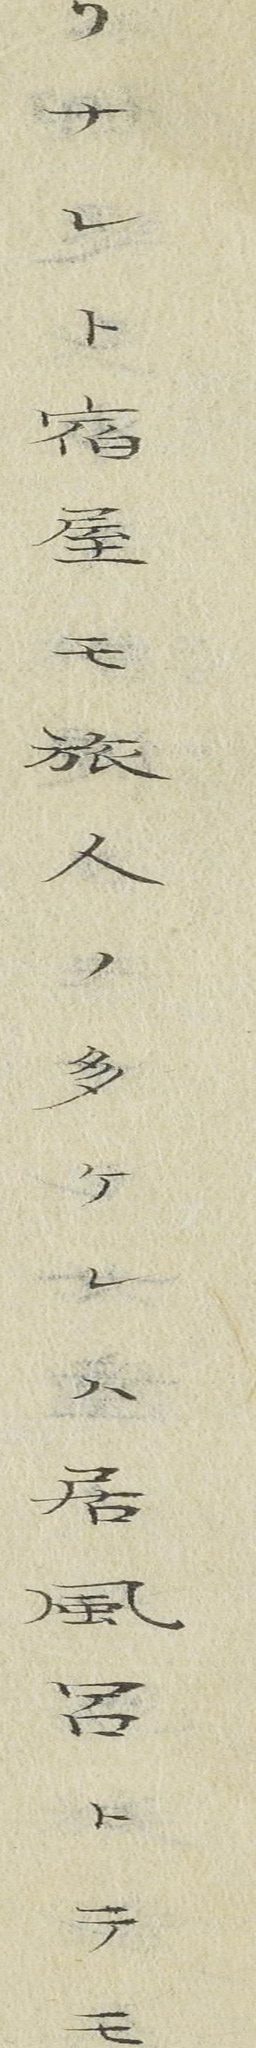リナレト宿屋モ旅人ノ多ケレハ居風呂トテモ
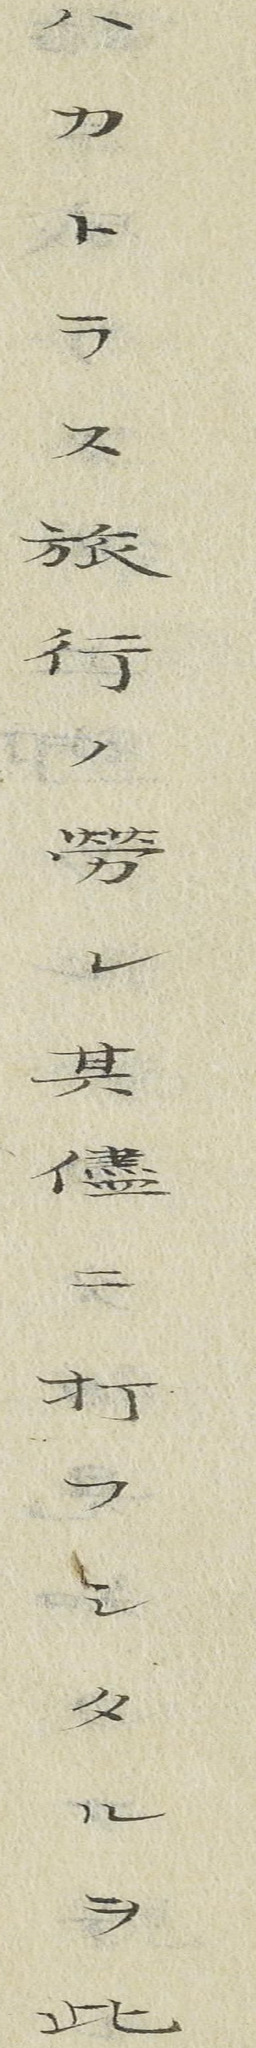ハカトラス旅行ノ労レ其侭ニ打フシタルヲ此
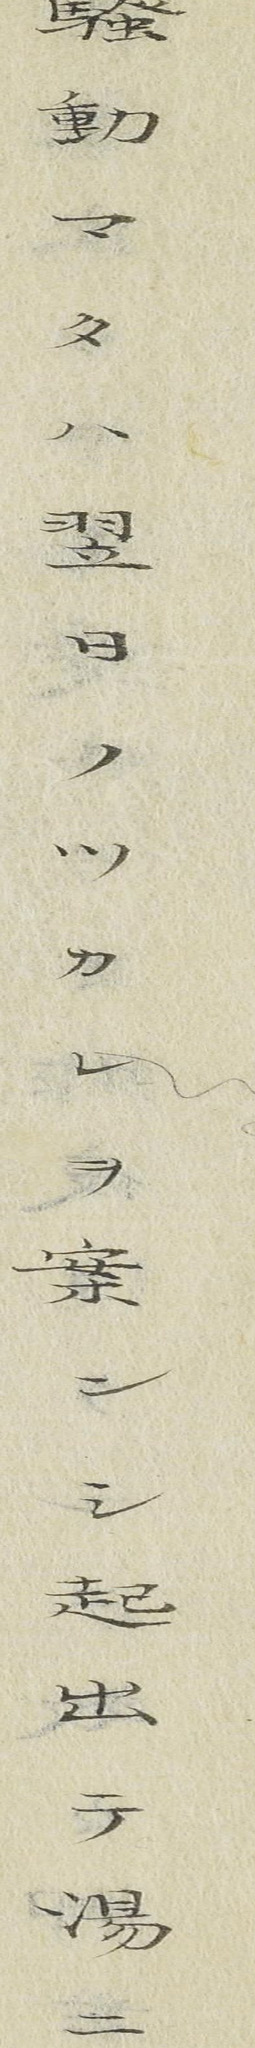騒動マタハ翌日ノツカレヲ案ンシ起出テ湯ニ
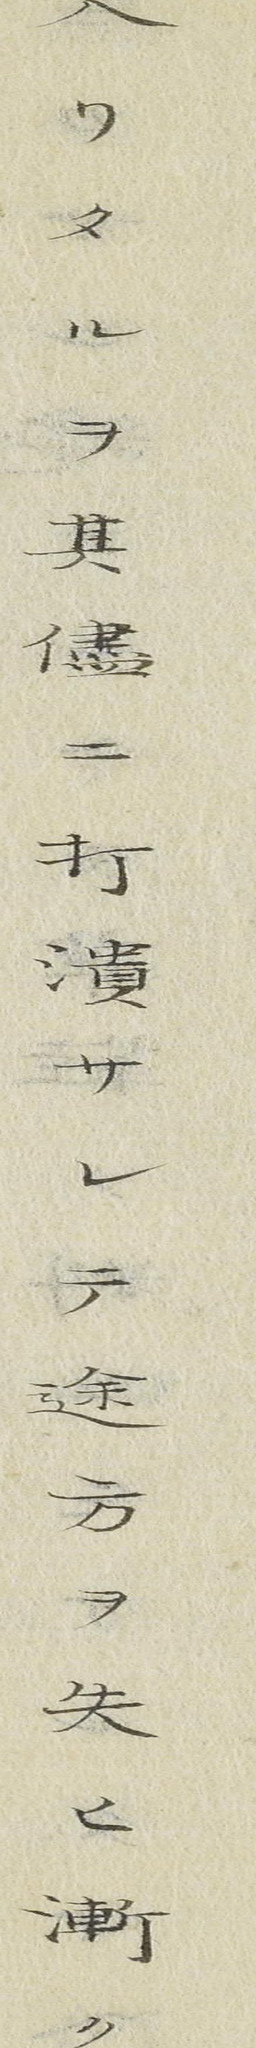入リタルヲ其侭ニ打潰サレテ途方ヲ失ヒ漸ク
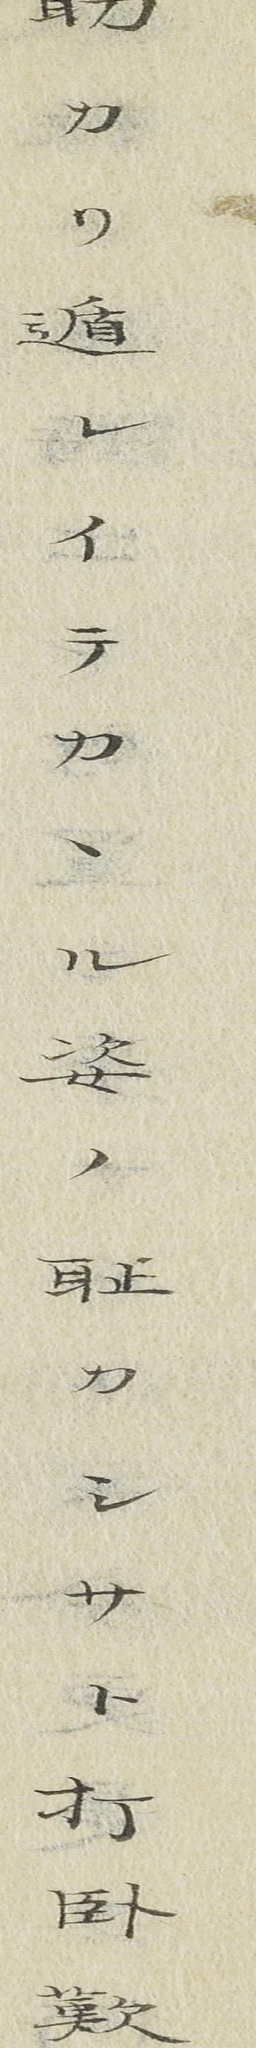助カリ遁レイテカヽル姿ノ恥カシサト打卧歎
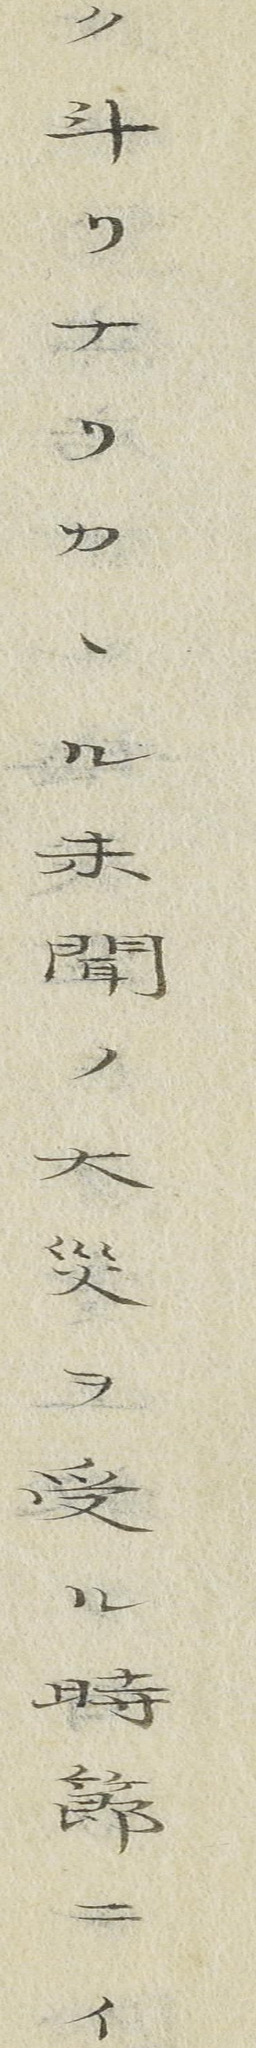ク斗リナリカヽル未聞ノ大災ヲ受ル時節ニイ
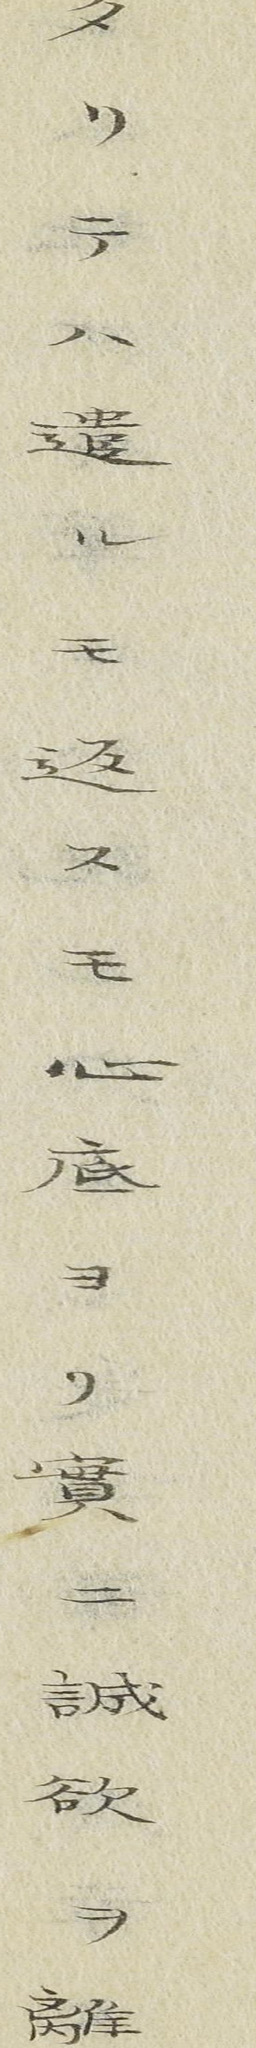タリテハ遺ルモ返スモ心底ヨリ実ニ誠欲ヲ離
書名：地災撮要　地震之部　巻ノ二
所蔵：東京大学地震研究所図書室 Earthquake Research Institute Library, The University of Tokyo, JAPAN
